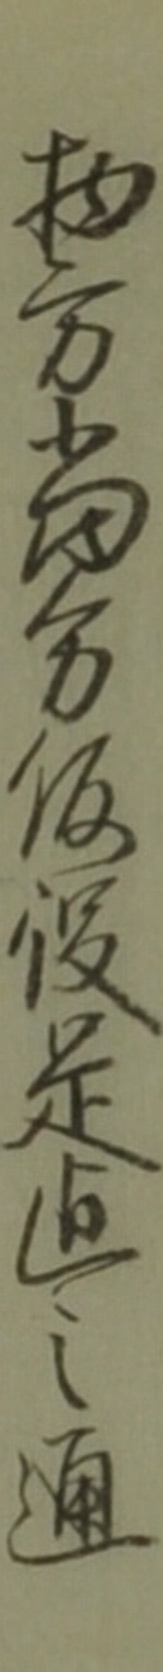物方当分仮役是迄之通
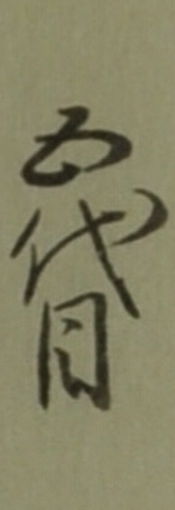五代目
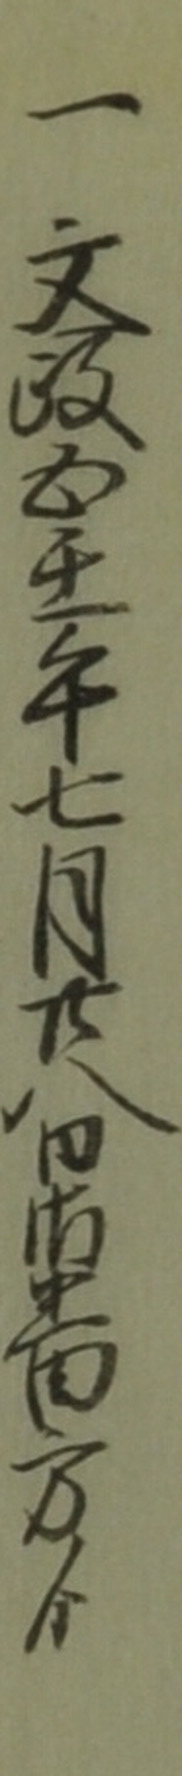一文政五壬午七月廿八日御番方ゟ
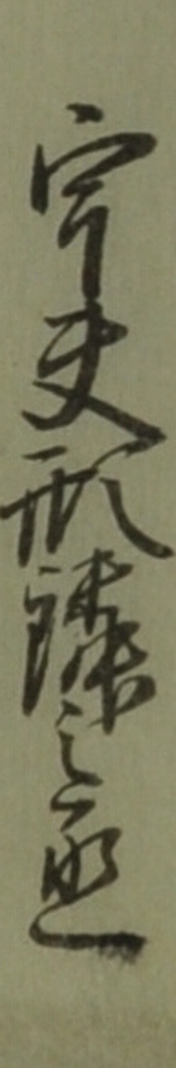宇夫形鱗之丞
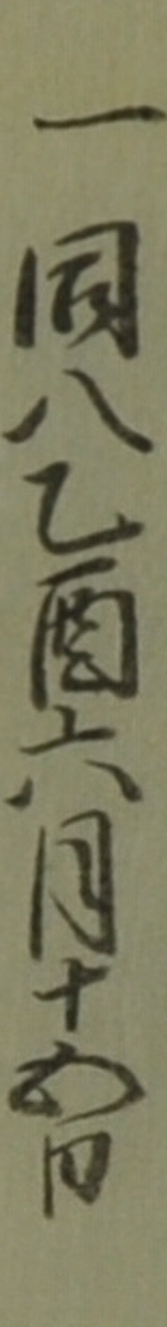一同八乙酉六月十十五日
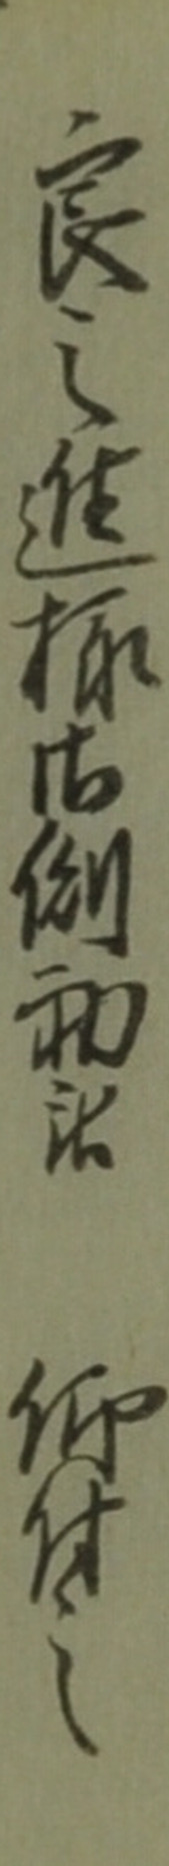良之進様御側被仰付之
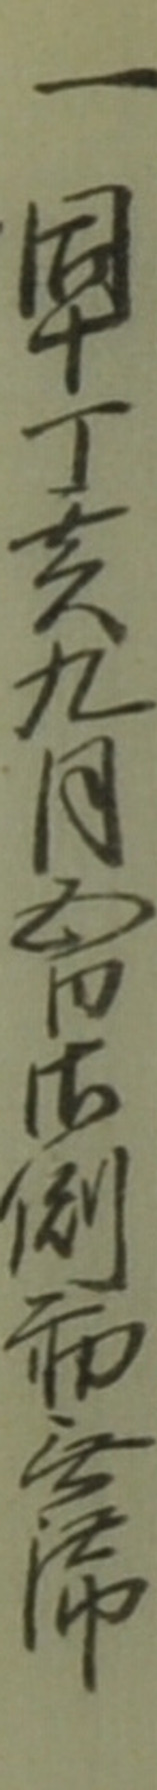一同十丁亥九月五日御側勤無滞
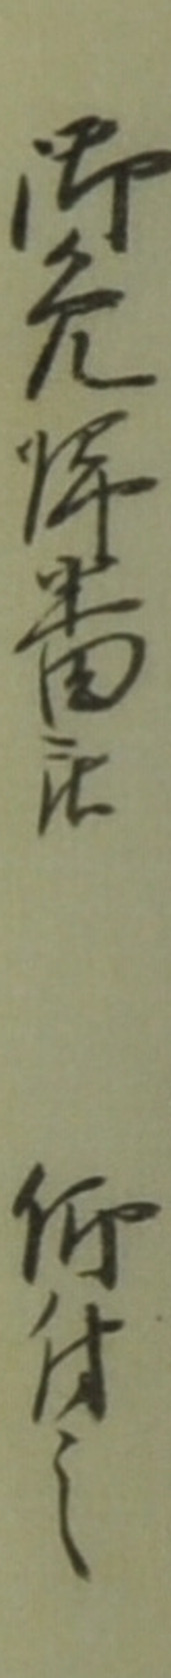御免帰番被仰付之
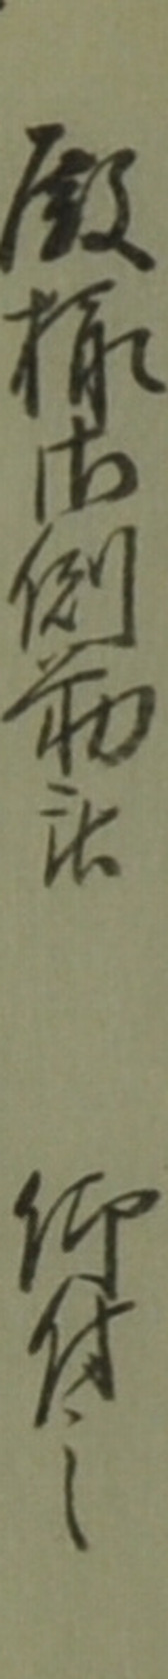殿様御側勤被仰付之

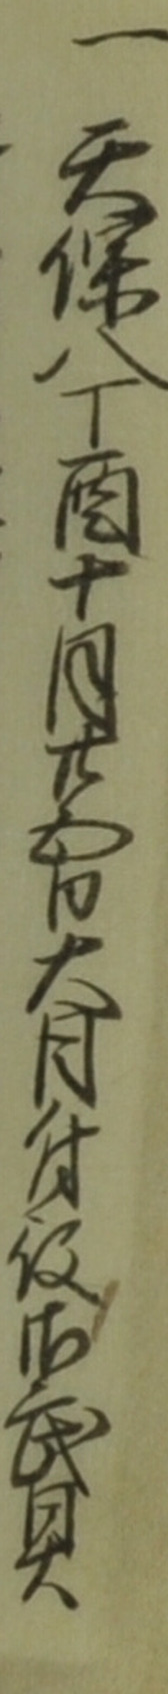一天保八丁酉十月廿五日大目付役御武具
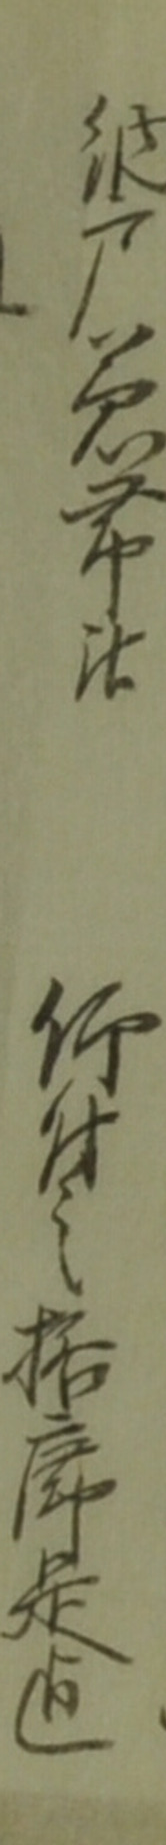納戸兼帯被仰付之格席是迄
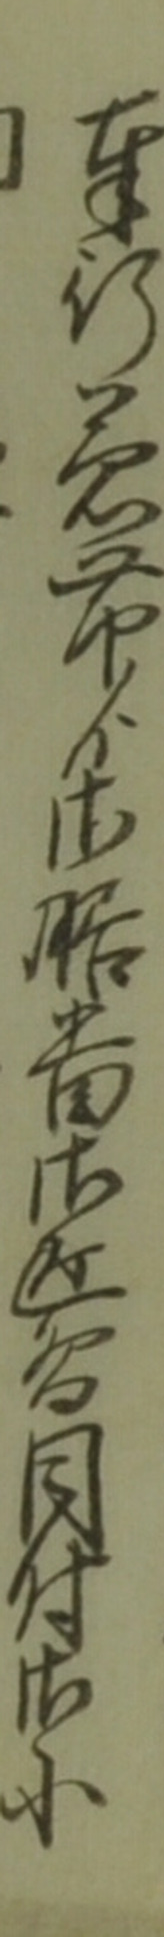奉行兼帯ゟ御膳番御近習目付御小
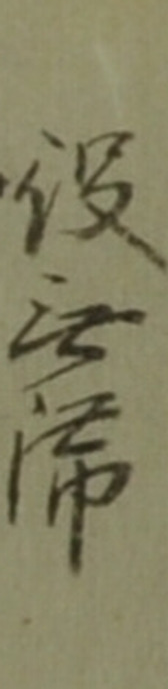役無滞
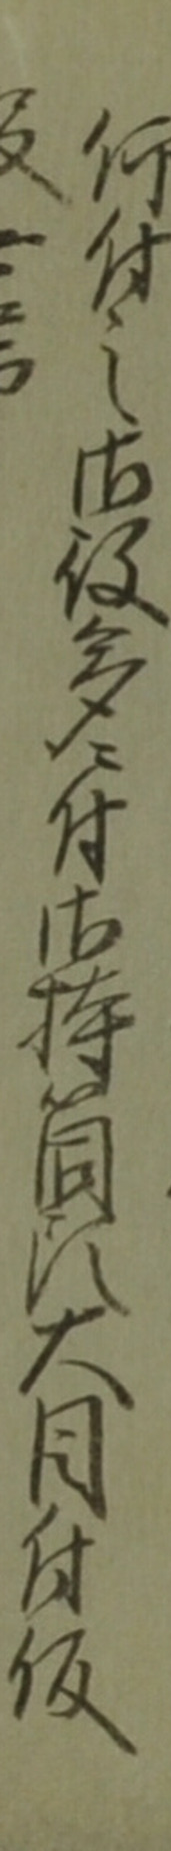仰付之御役多ニ付御持筒頭大目付仮
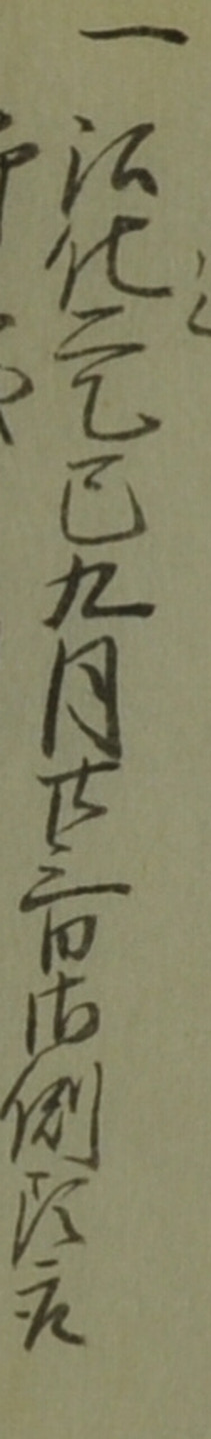一弘化二乙巳九月廿三日御側頭取
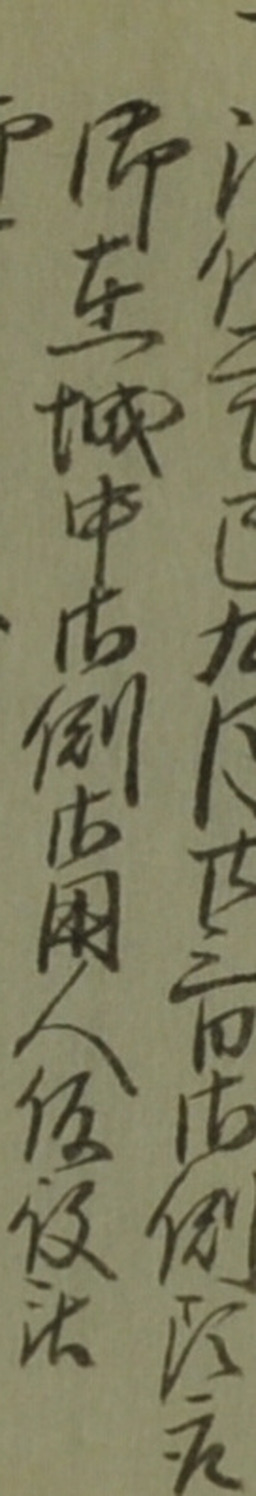御在城中御側御用人仮役被
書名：諸御役代々録（五）
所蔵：伊那市立高遠町図書館・合同会社AMANE
